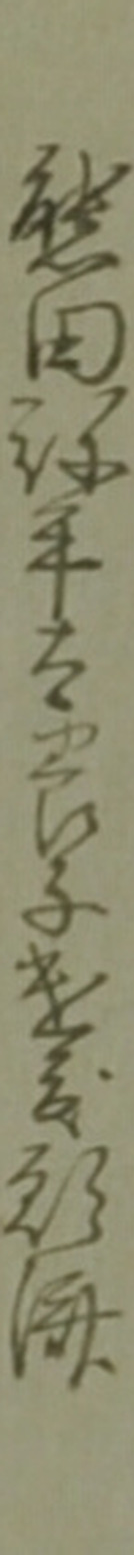熊田弥平太養子遣度願済
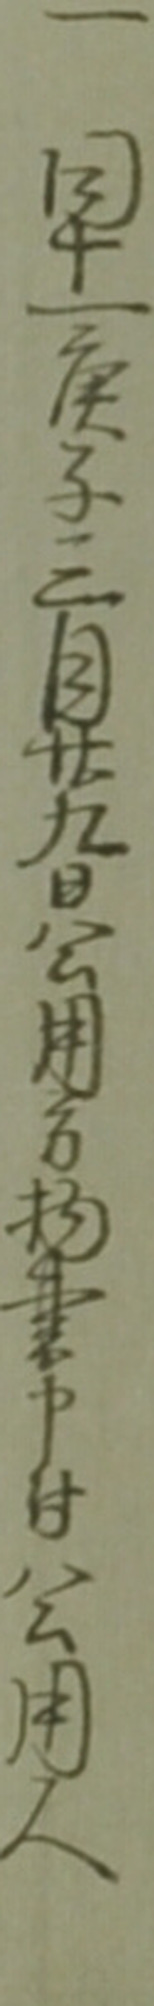一同十一庚子三月廿九日公用方物書申付公用人
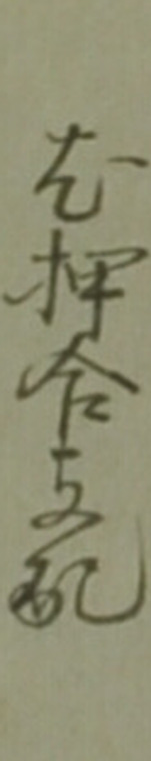尤押合支配
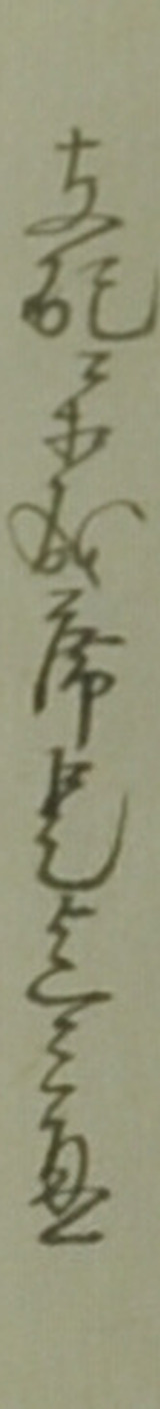支配ニ相成席是迄之通
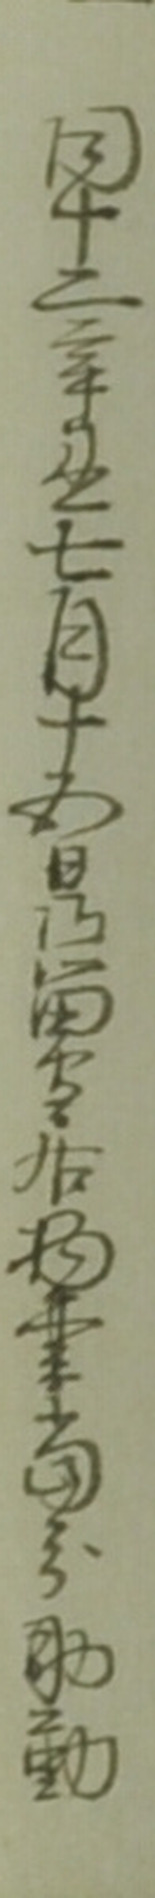一同十二辛丑七月十五日御留守居物書当分助勤

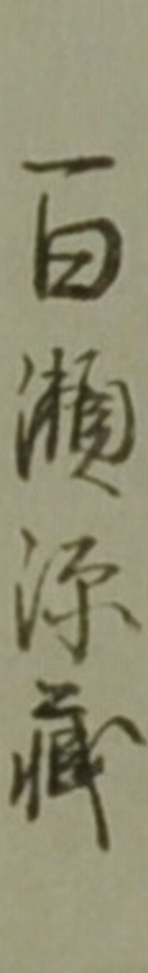百瀬源蔵
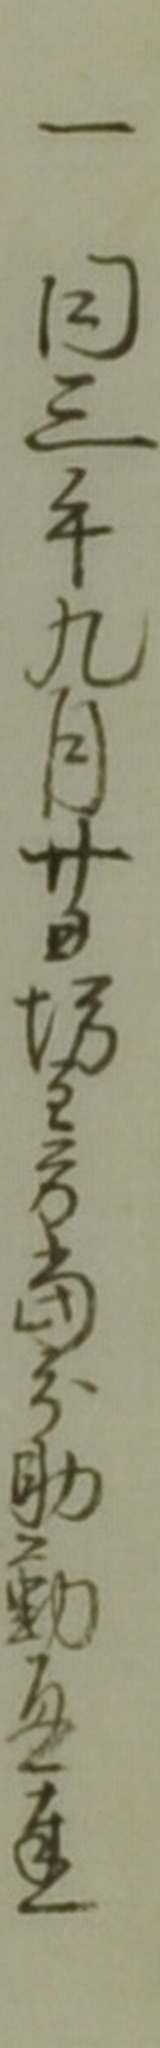一同三午九月廿日坊主方当分助勤通達
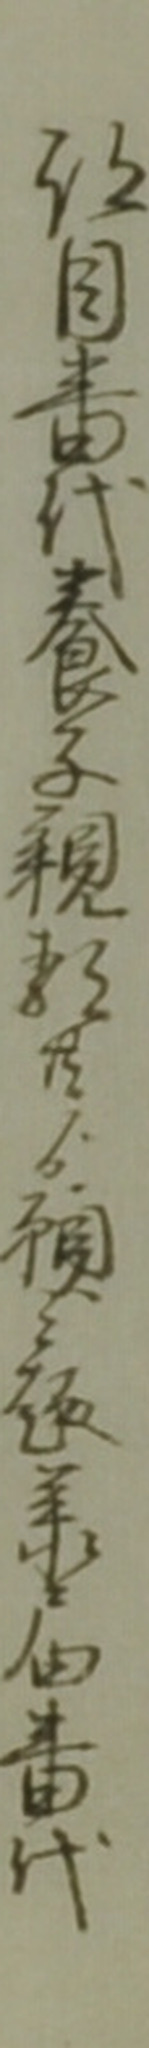跡目番代養子親類共ゟ願之趣承届番代
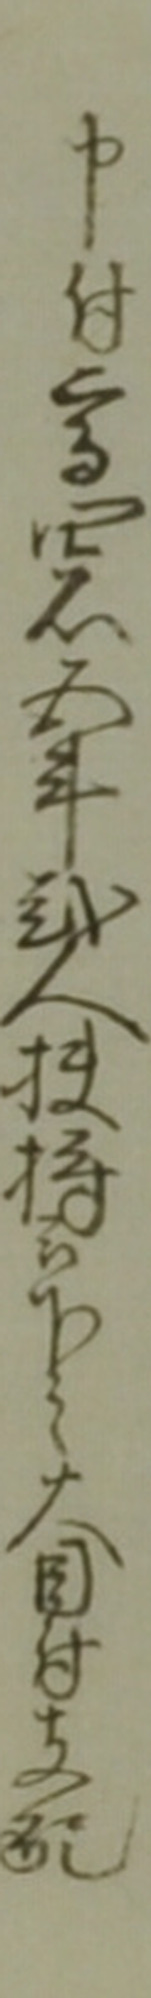申付高四石五斗弐人扶持被下之大目付支配
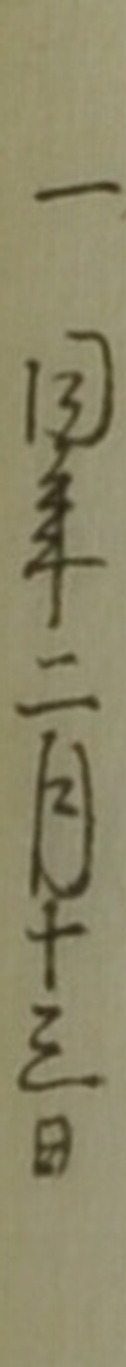一同年二月十三日
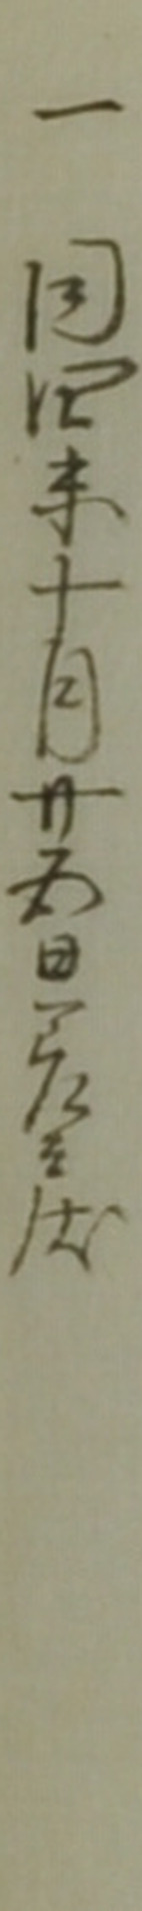一同四未十月廿五日差戻
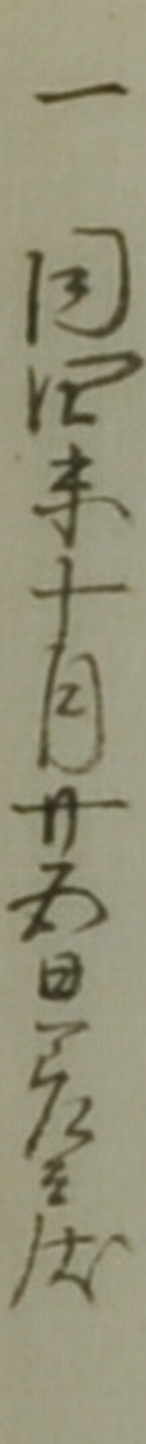一同四未十月廿五日差戻
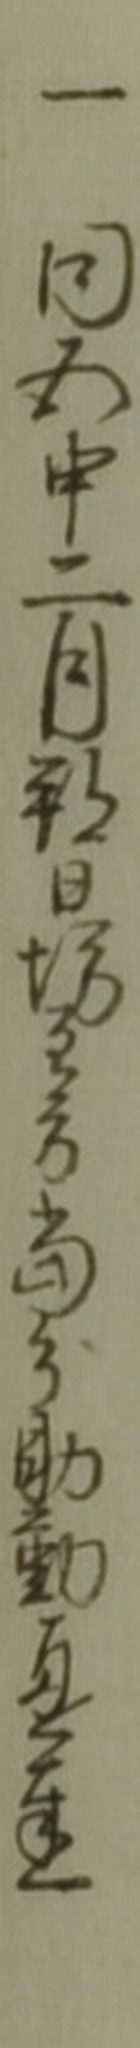一同五申二月朔日坊主方当分助勤通達
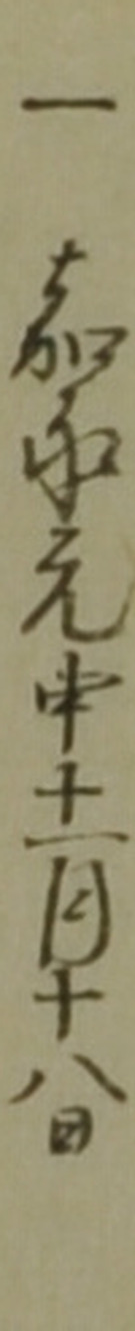一嘉永元申十一月十八日
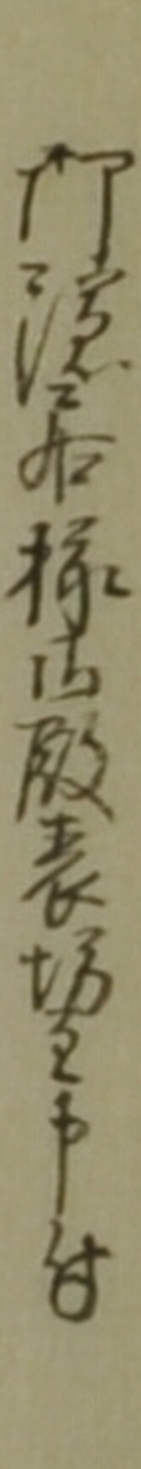御隠居様御殿表坊主申付
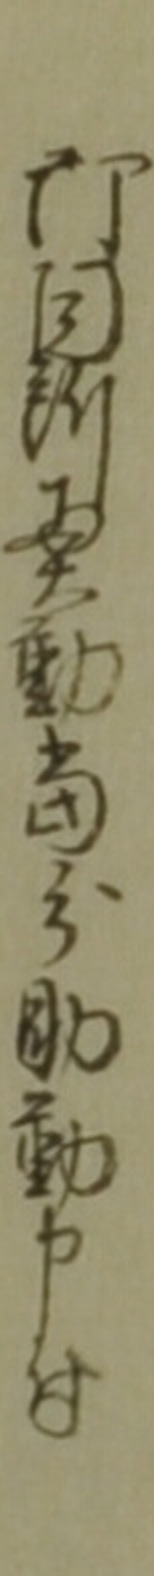御同所奥勤当分助勤申付
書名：無足諸士勤仕録（九）
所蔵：伊那市立高遠町図書館・合同会社AMANE
